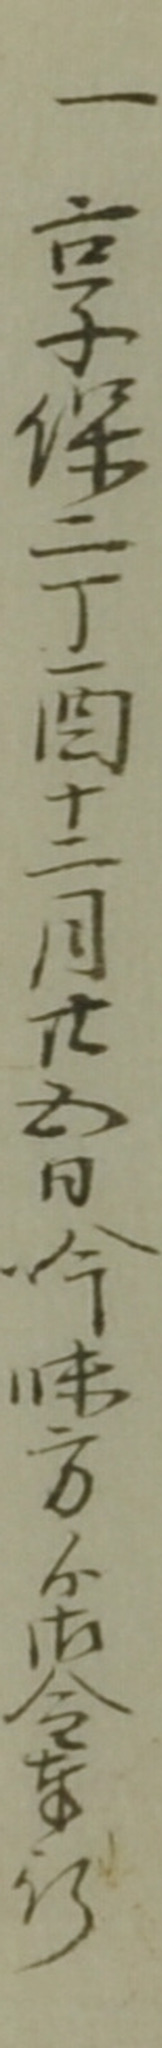一享保二丁酉十二月廿五日吟味方ゟ御金奉行
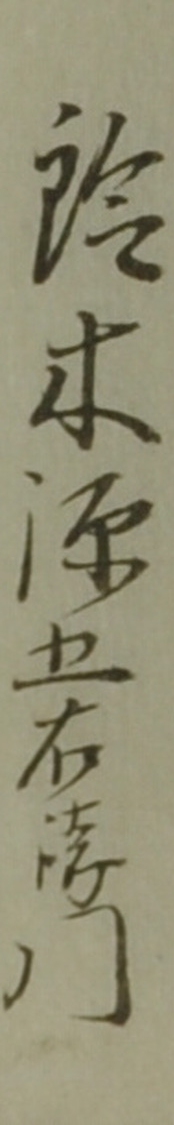鈴木源五右衛門
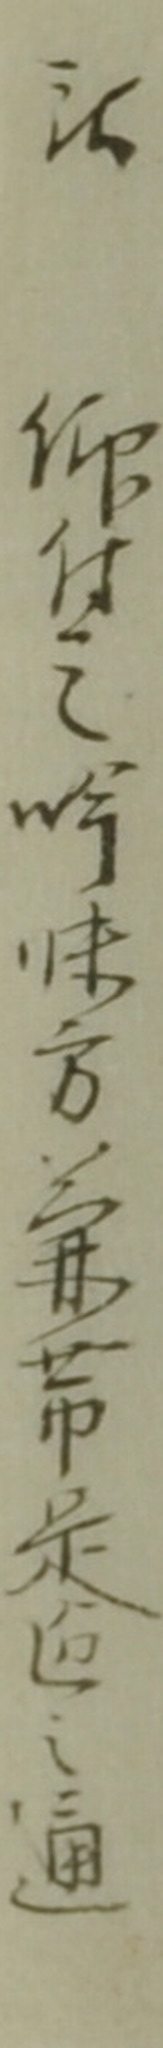被仰付之吟味方兼帯是迄之通

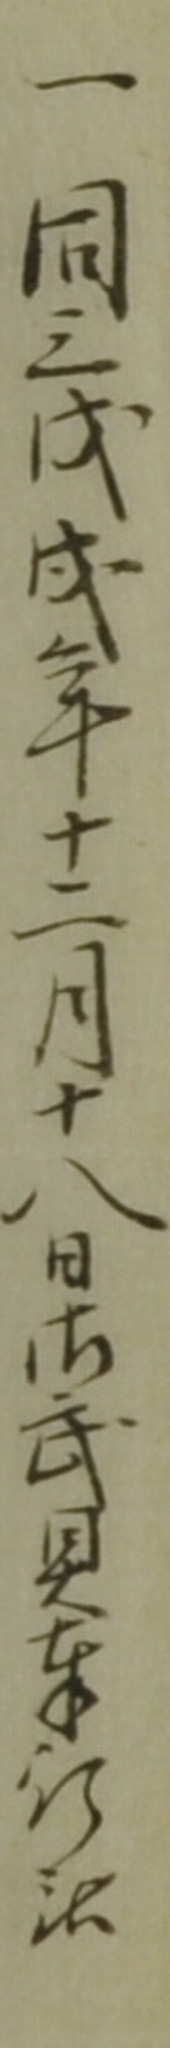一同三戊戌年十二月十八日御武具奉行被
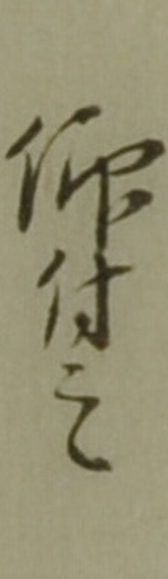仰付之
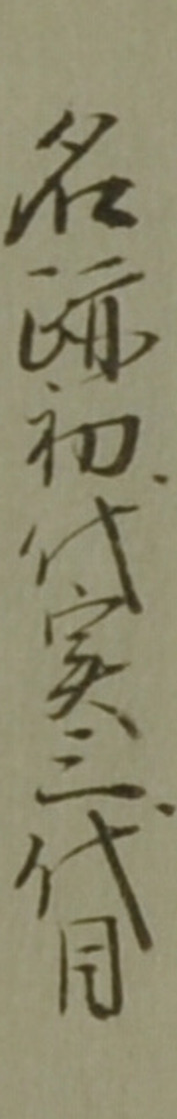名跡初代実三代目
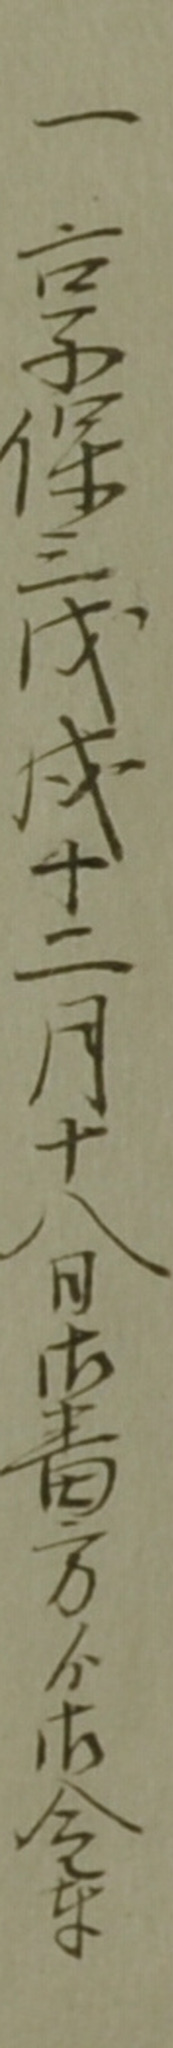一享保三戊戌十二月十八日御番方ゟ御金奉
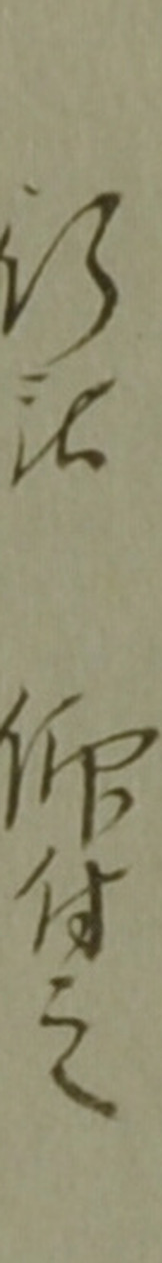行被仰付之
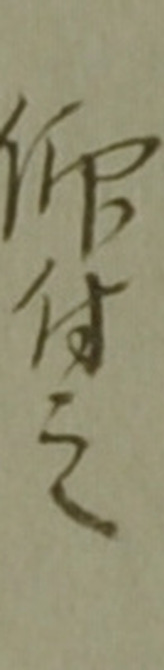仰付之
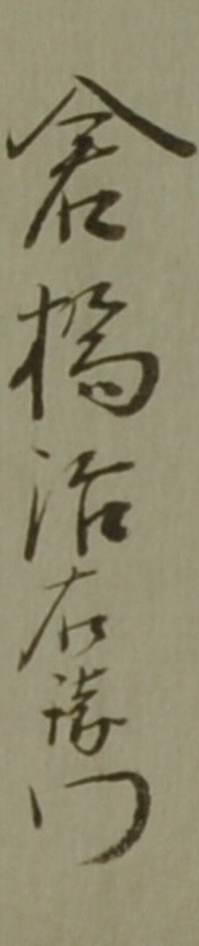倉橋治右衛門
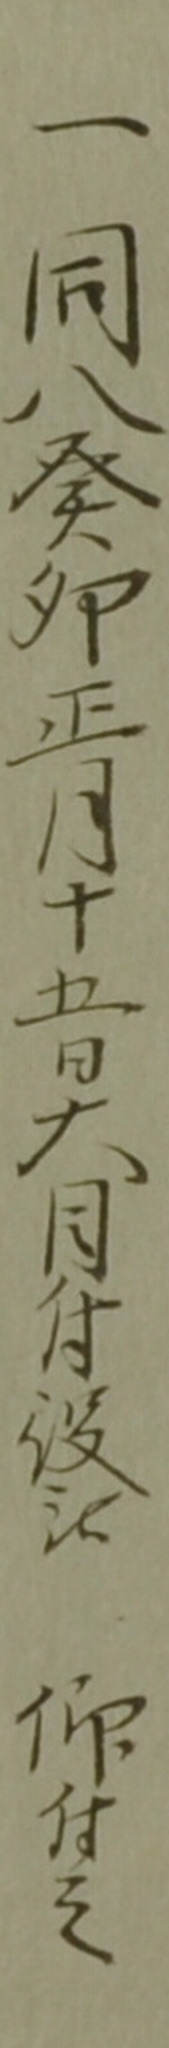一同八癸卯正月十五日大目付被仰付之
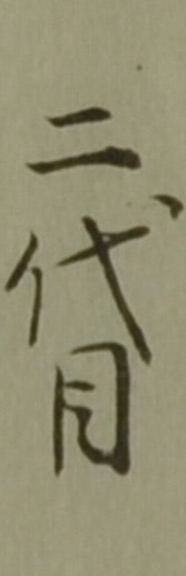二代目
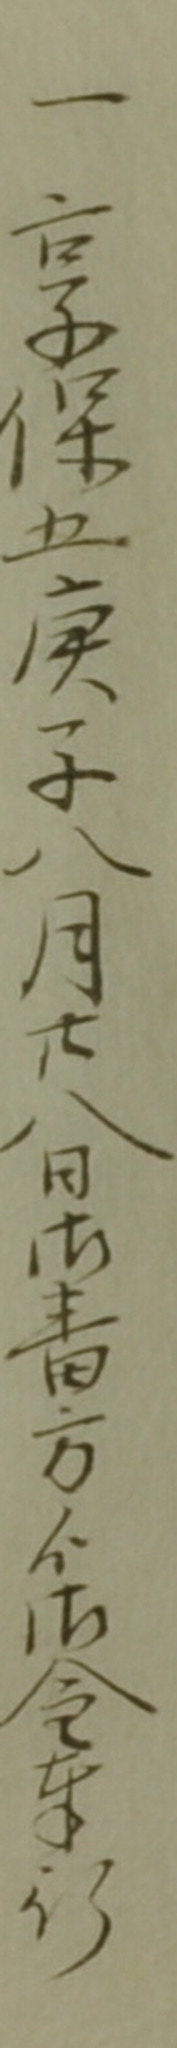一享保五庚子八月廿八日御番方ゟ御金奉行
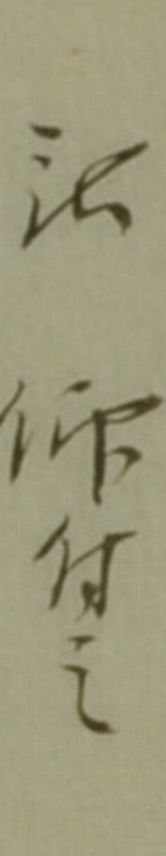被仰付之
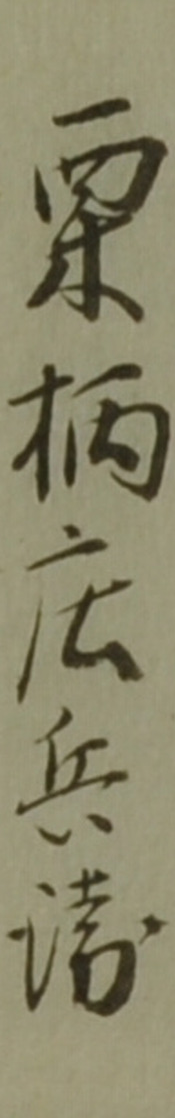栗栖庄兵衛
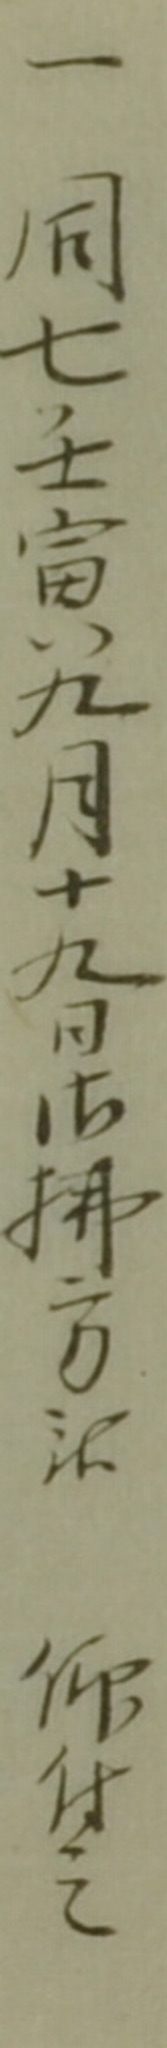一同七壬寅九月十九日御払方被仰付之
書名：諸御役代々録（七）
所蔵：伊那市立高遠町図書館・合同会社AMANE
